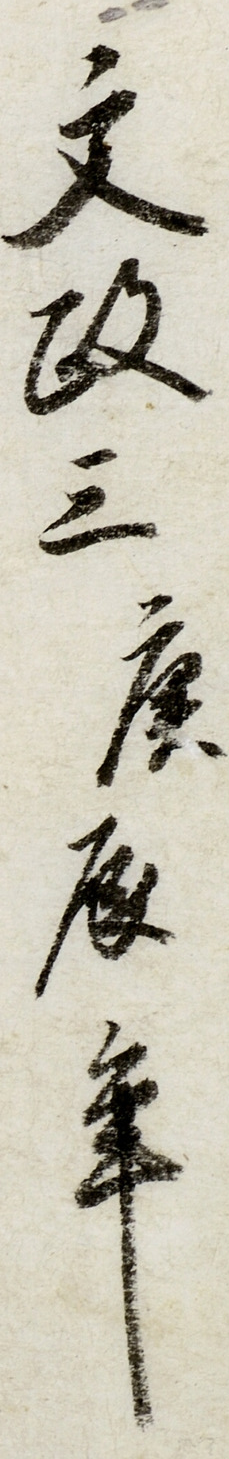文政三庚辰年
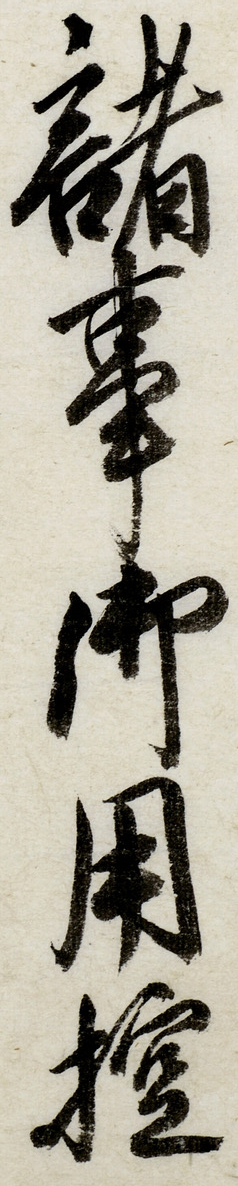諸事御用控
